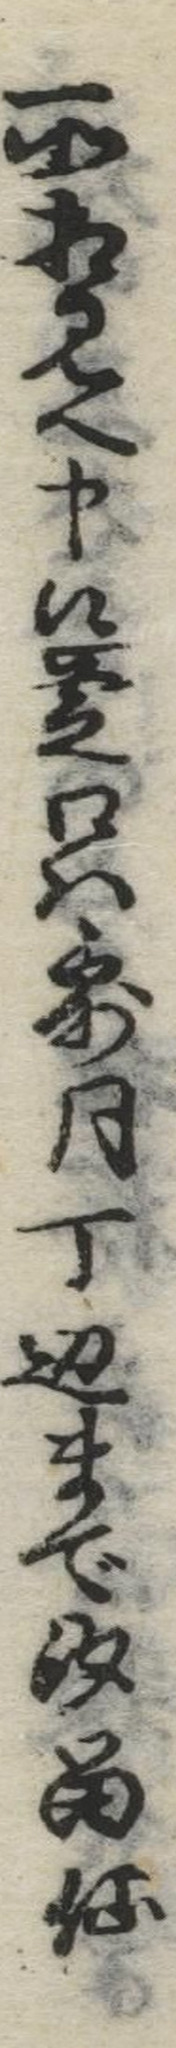所相見へ申候芝口ハ露月丁辺迄汐留仙
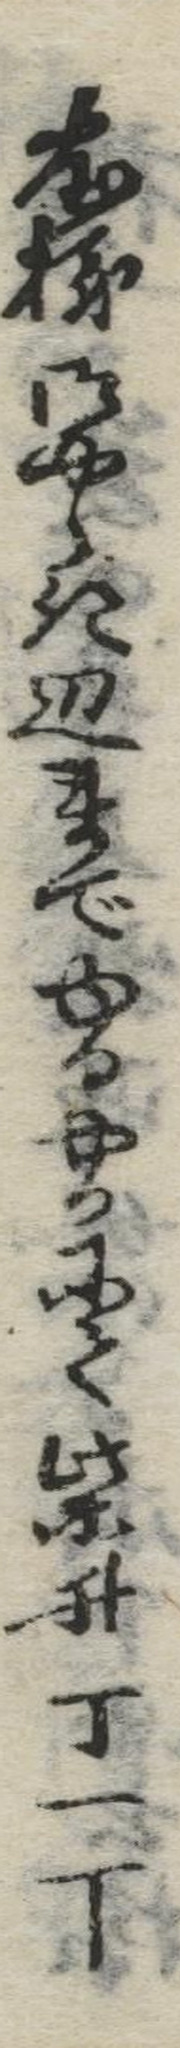台様御やしき辺までゆるやかにて柴井丁一丁
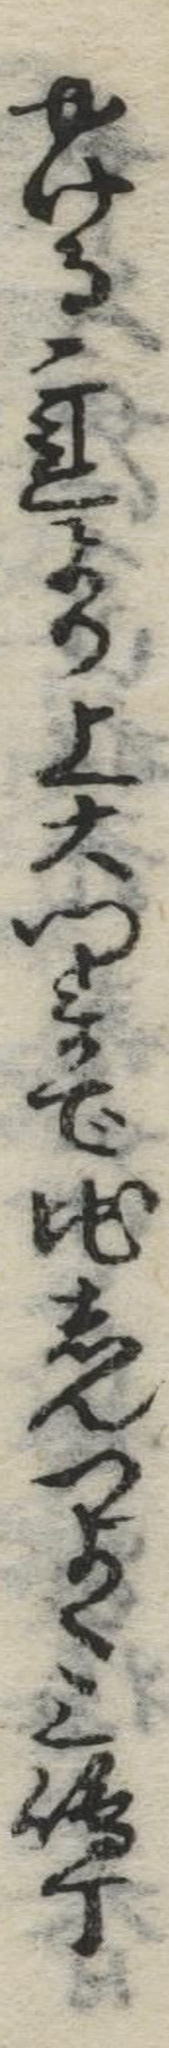やけるこれより上大門まで地しんつよく三崎丁
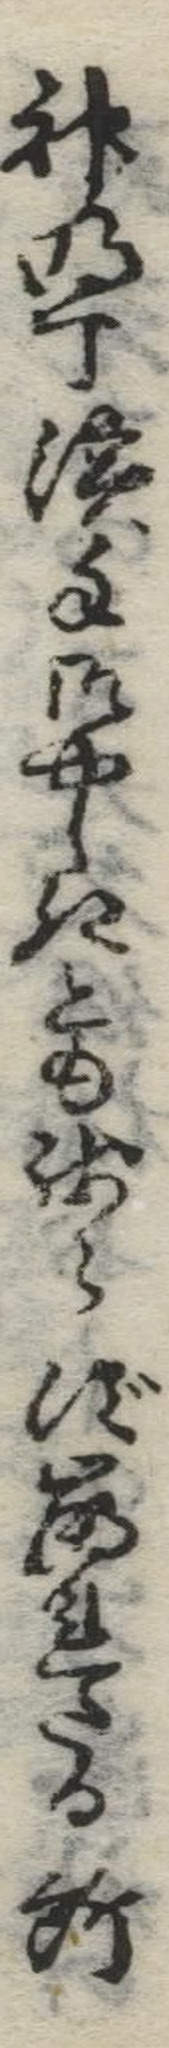神明丁浜手御やしきとも残らず崩れたる所
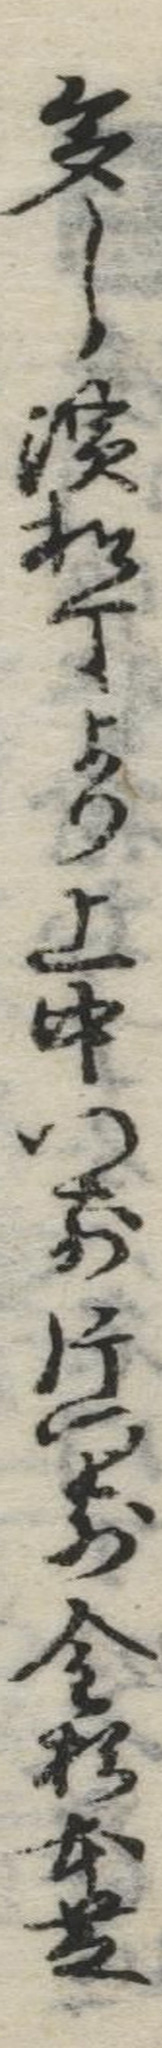多し浜松丁より上中門前方片門前金杉本芝
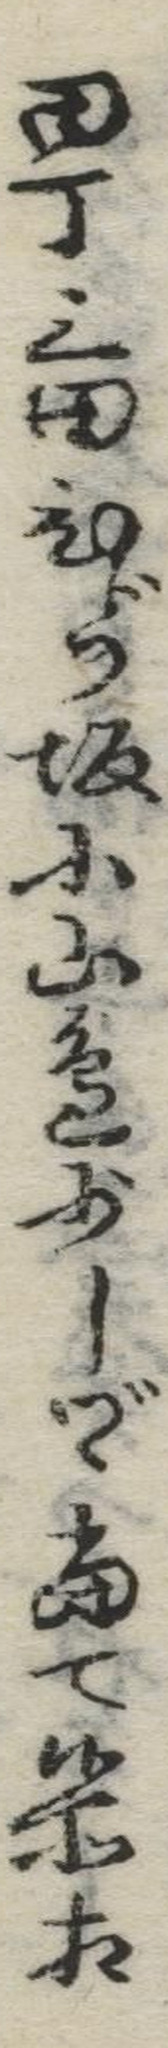田丁三田ひじか坂小山辺少しヅゝ当て候所相
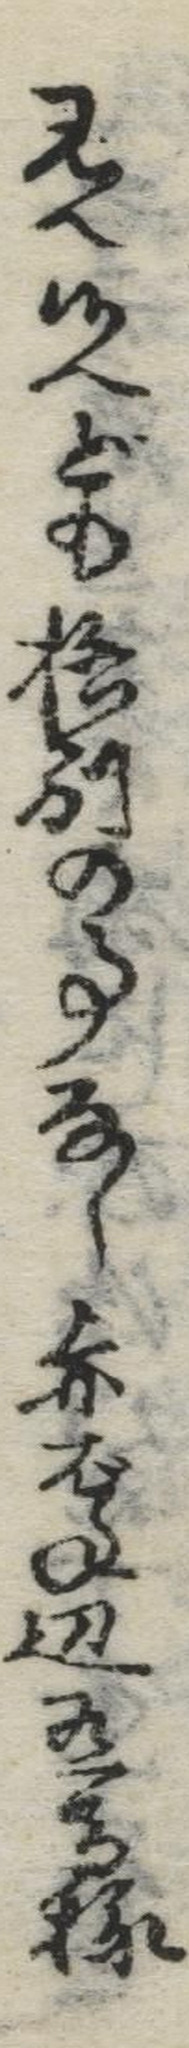見へ候へども格別の事なし赤ばね辺有馬様
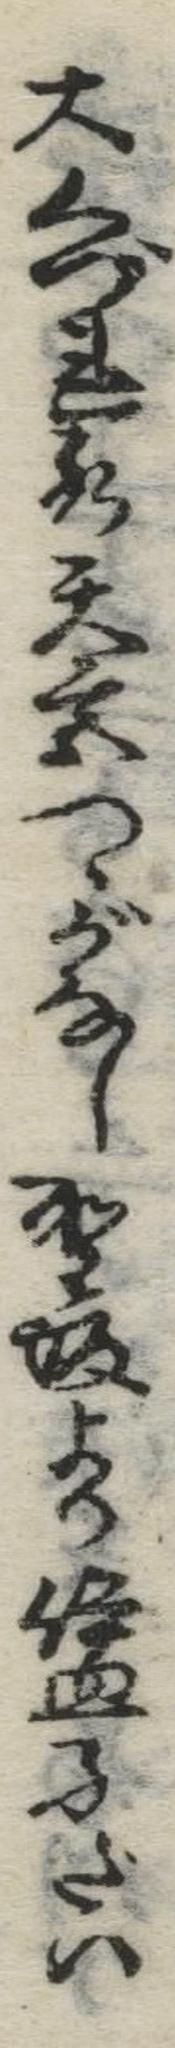大くづれ水天宮つゝがなし聖坂より伊皿子台
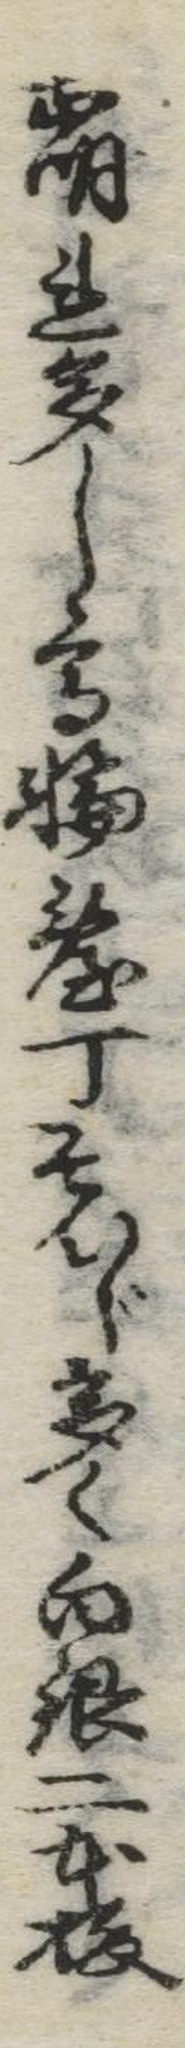崩れ多し高輪台丁そんじ多く白銀二本榎
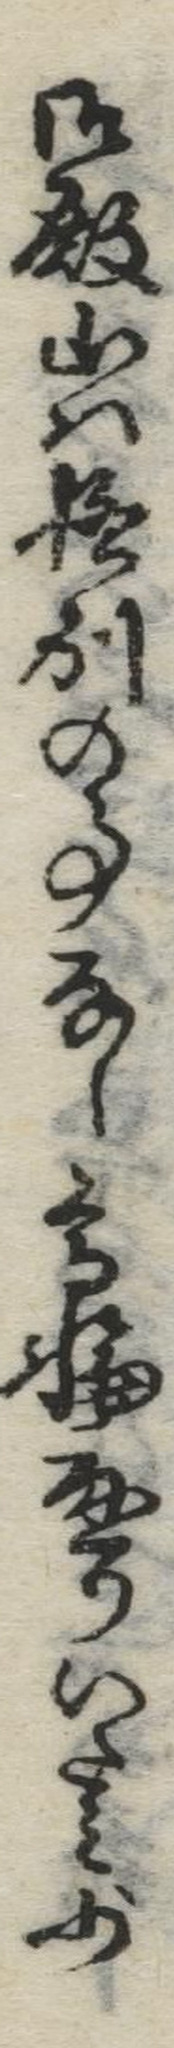御殿山ハ格別の事なし高輪通りいたミ少
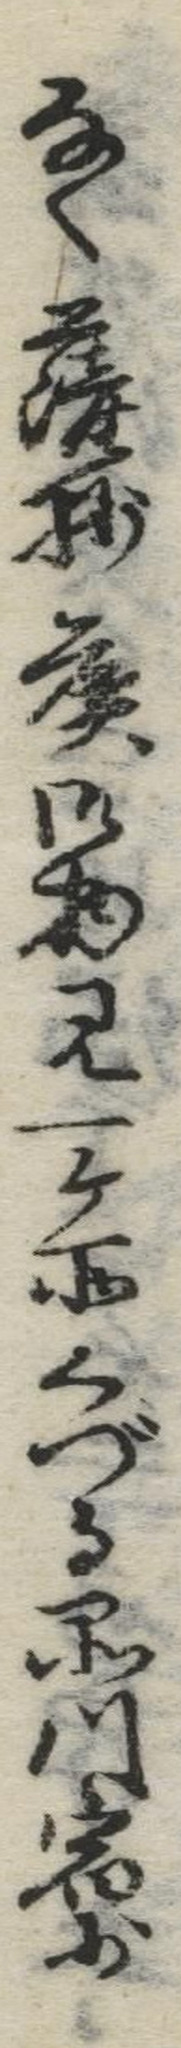なく薩州矦御物見一ヶ所くづる品川宿少
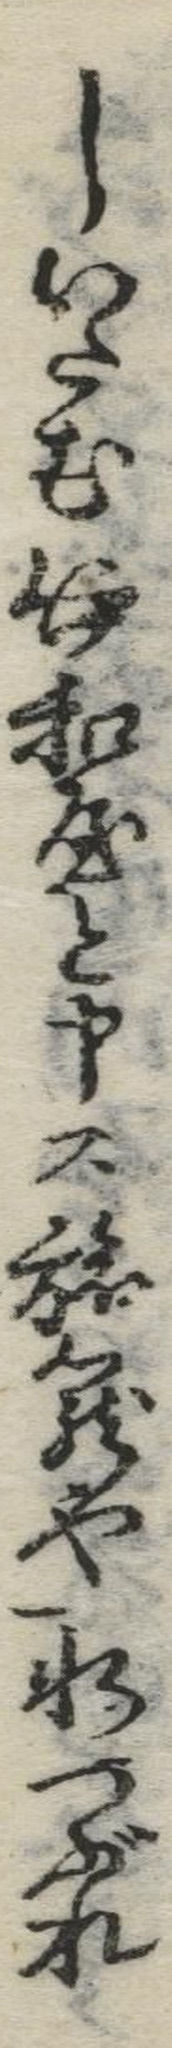しいたむ伊和屋と申ㇲ旅籠や一軒つぶれ
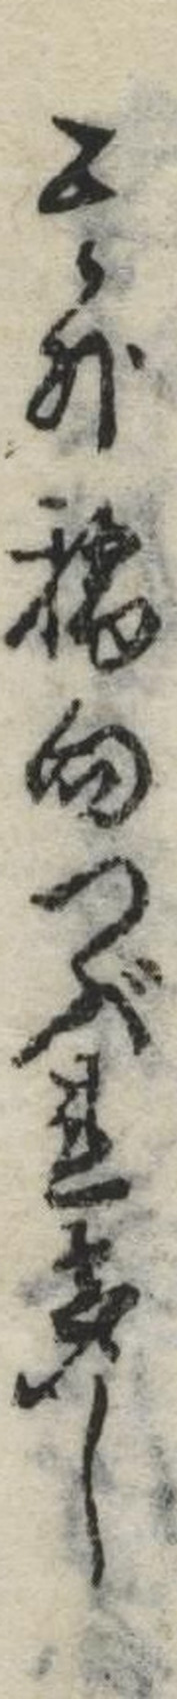其外橋向つぶれ多し
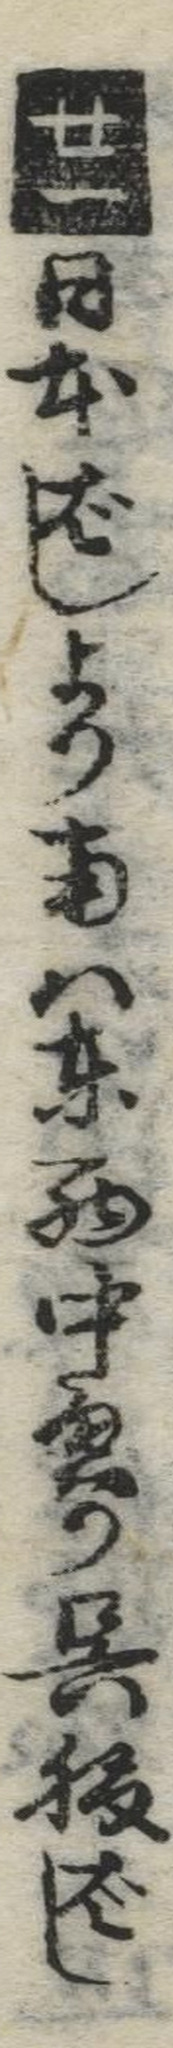廿一日本ばしより南ハ東西中通り呉服ばし
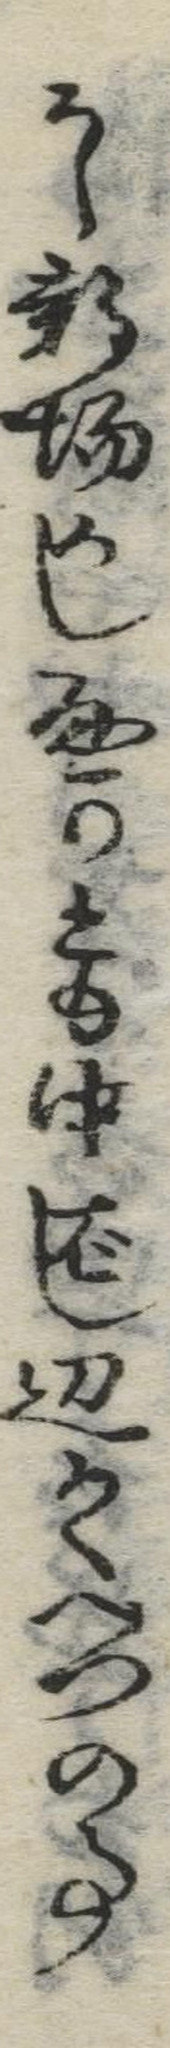うら新場かし通りとも中ばし辺かくへつの事
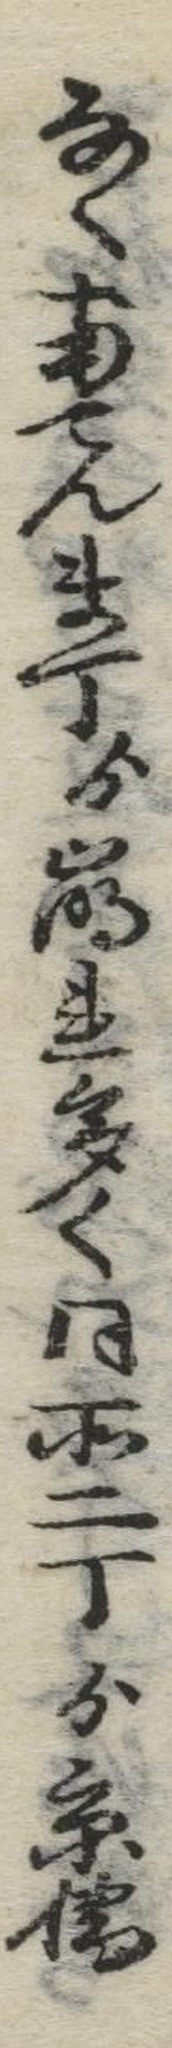なく南てんま丁ゟ崩れ多く同所二丁ゟ京橋
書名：安政二卯十月二日夜四ツ時過　御府内御屋敷方市中共　地震類焼場所明細書之寫　并街道筋近郷聞書
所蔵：東京大学地震研究所図書室 Earthquake Research Institute Library, The University of Tokyo, JAPAN
